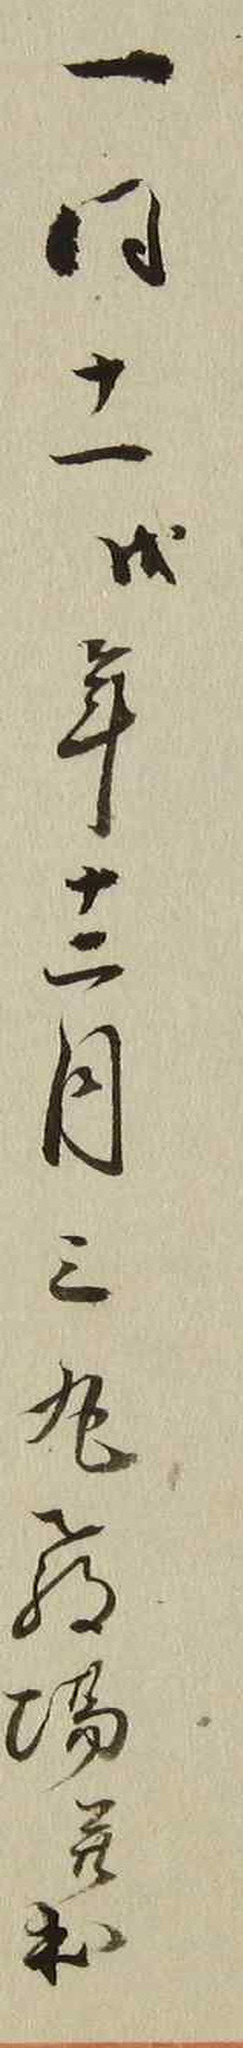一同十一戌年十二月三丸教場幷本
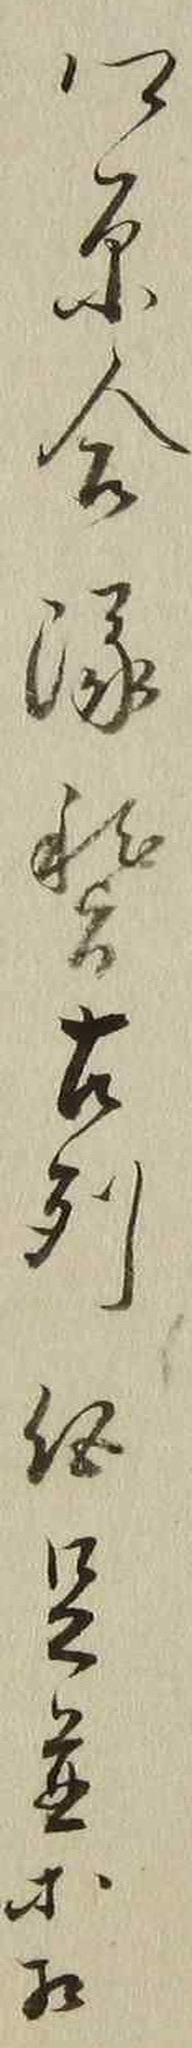郷原合隊稽古列伍足並等相
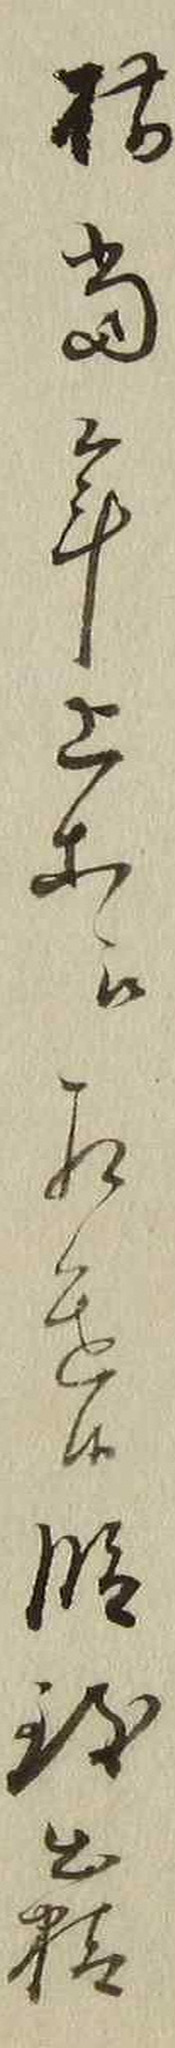揃当年上等江相進候段致出精
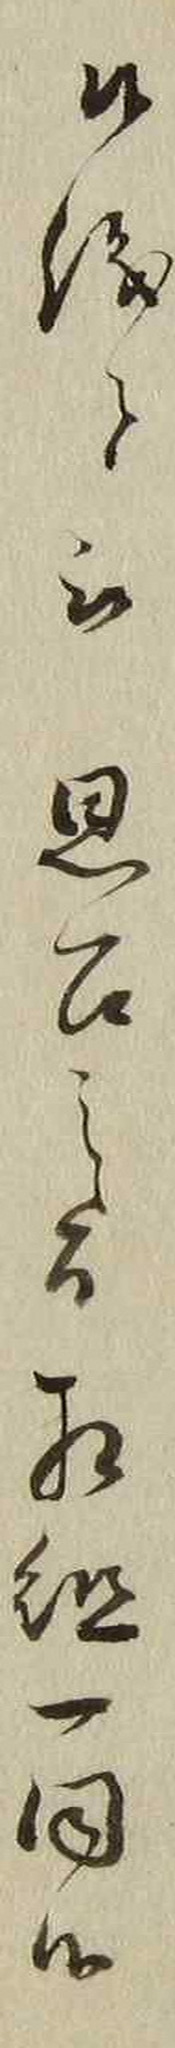候儀と被思召之旨相組一同御
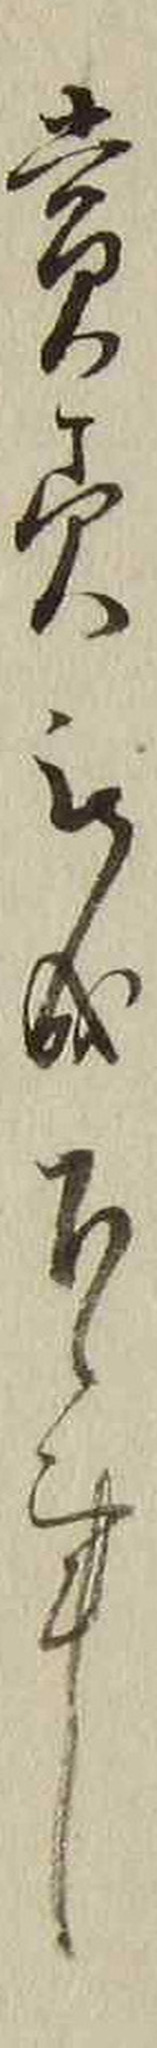賞美被成下候事
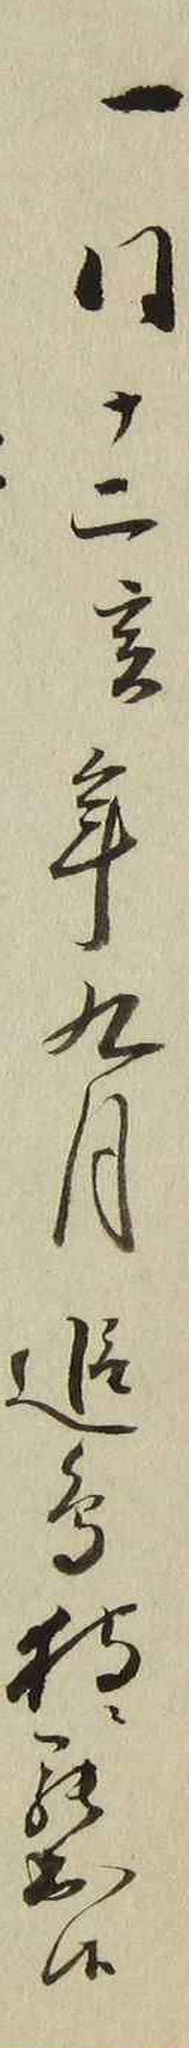一同十二亥年九月追鳥狩ニ罷出候
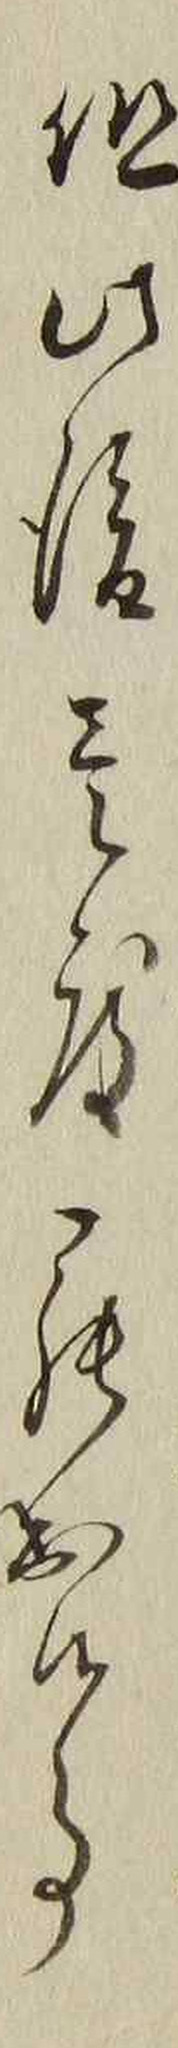但此後壱度罷出候事
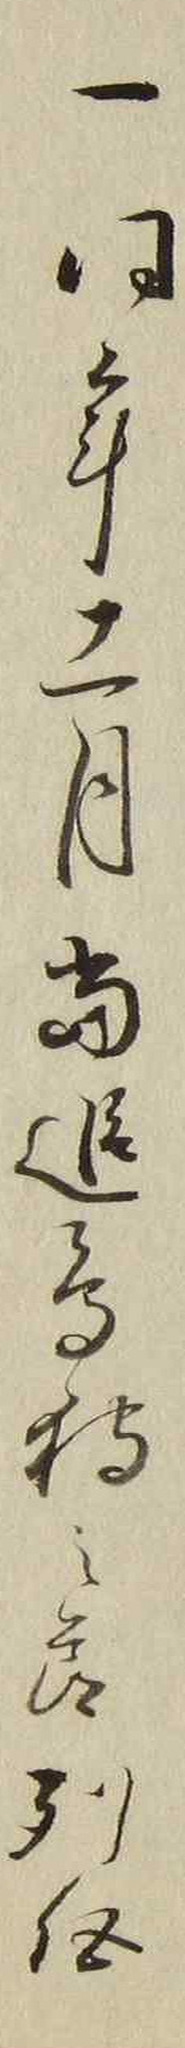一同年十一月当追鳥狩之節列伍
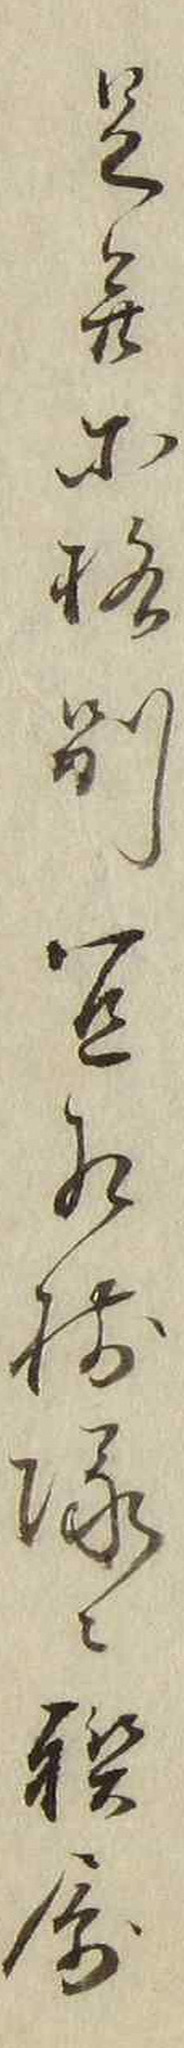足並等格別宜相揃隊々聯属
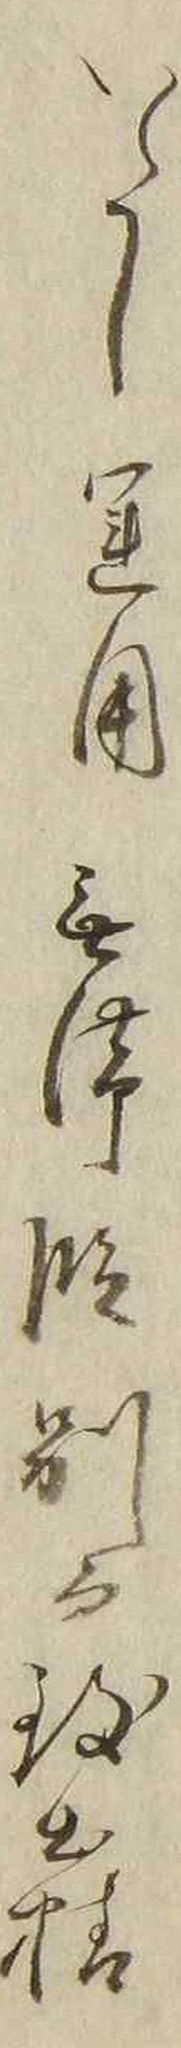いたし運用無滞段別而致出精

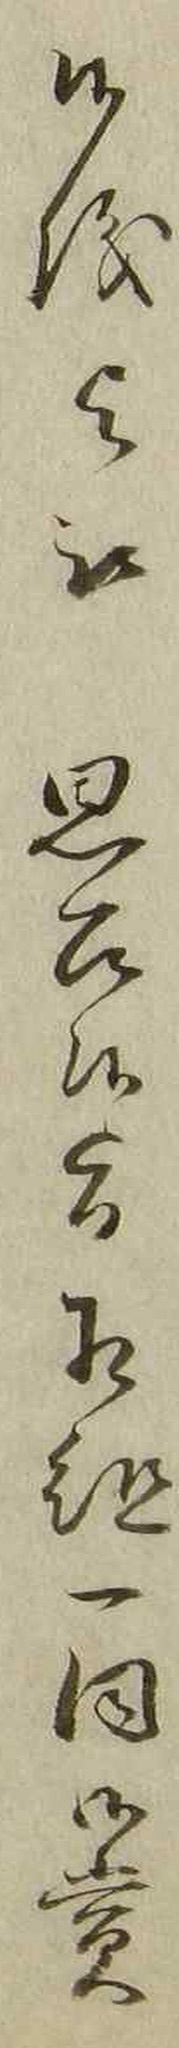候儀与被思召候旨相組一同御賞
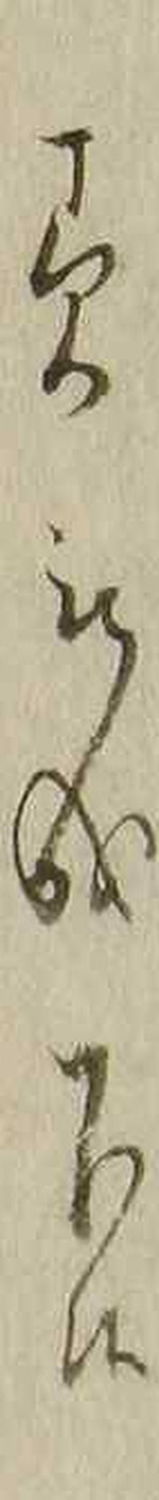美被成下候
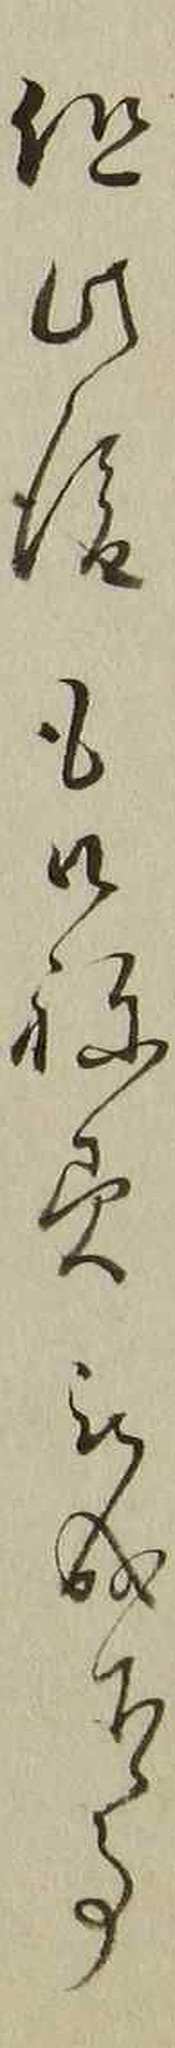但此後も御称美被成下候事
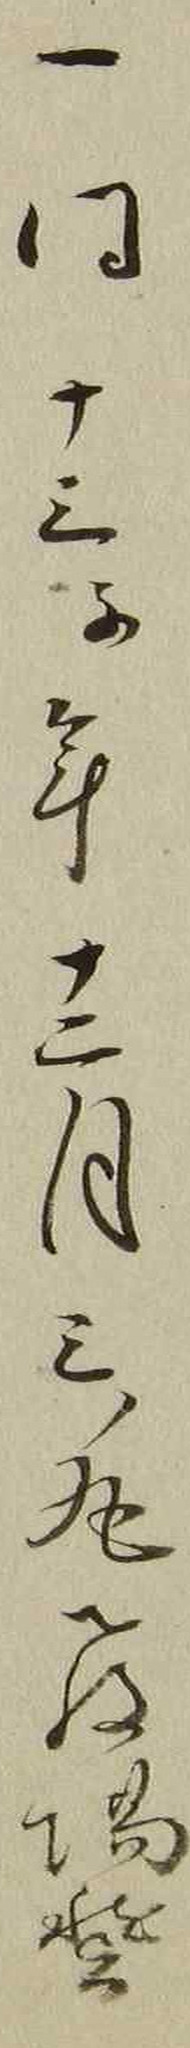一同十三子年十二月三ノ丸教場稽
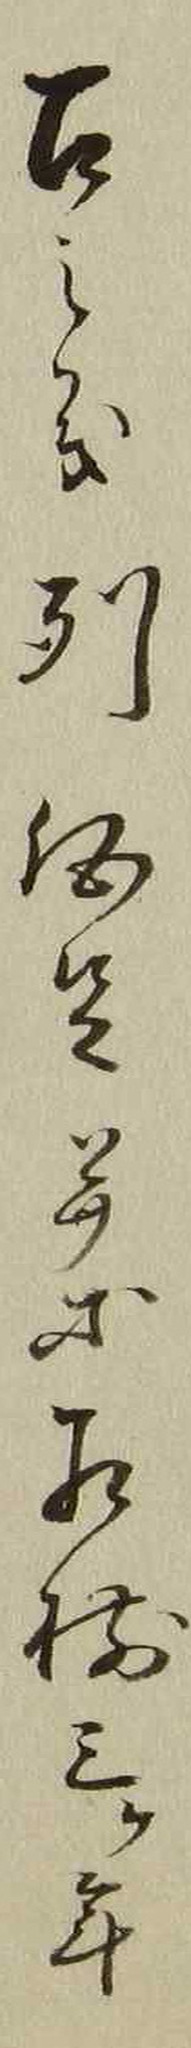古之義列伍足並等相揃三ヶ年
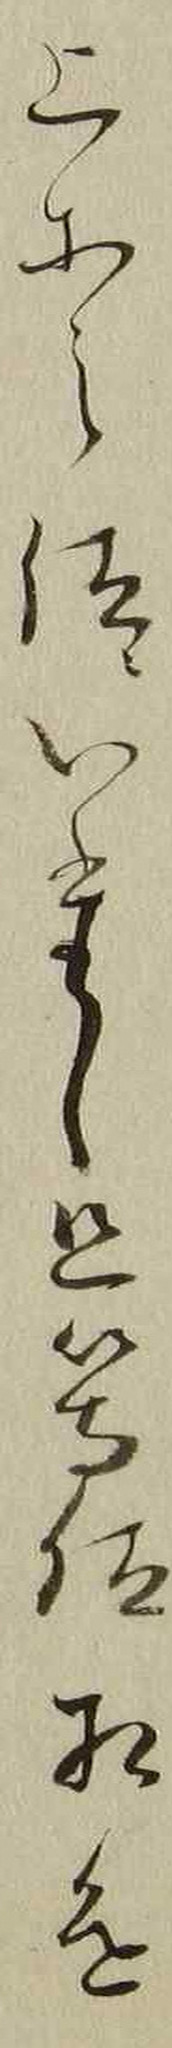上等之位ニいたし且等位相進
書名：諸士系譜　巻之129　た之部5
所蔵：会津若松市立会津図書館
